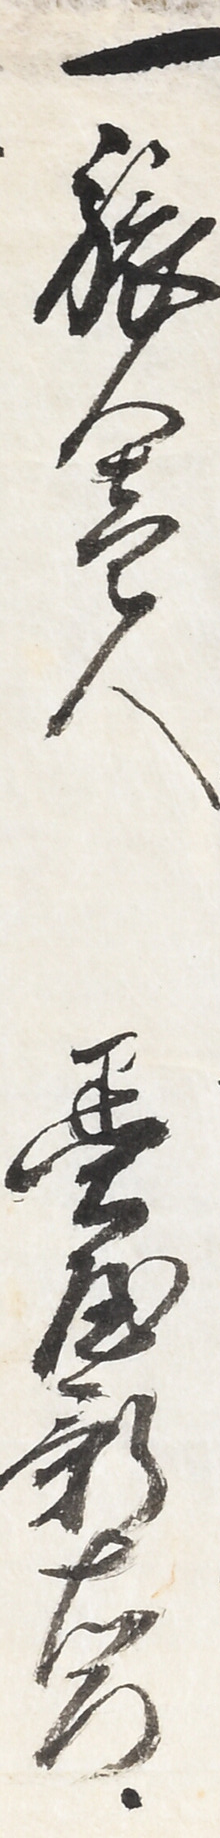一旅人壱人墨屋新右衛門・
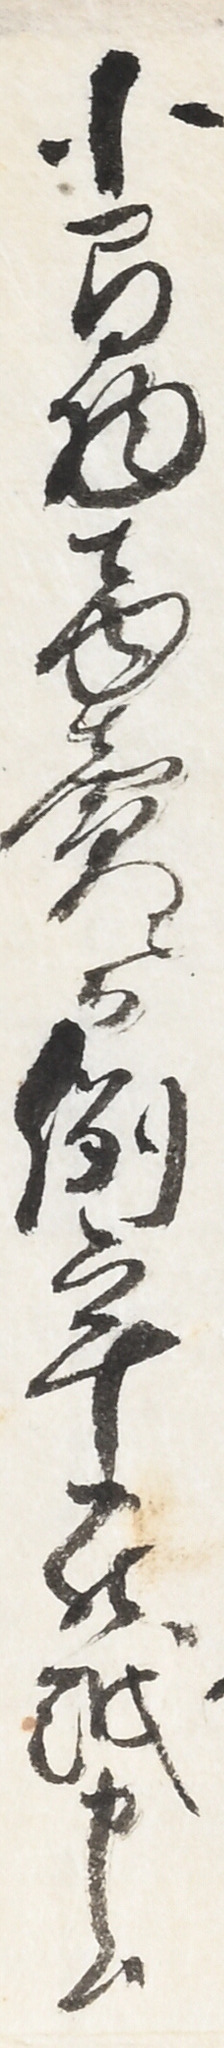小間物商売ニ而例年罷越申候
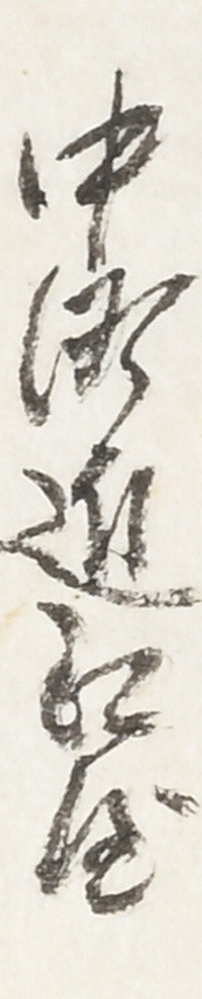中町近江屋
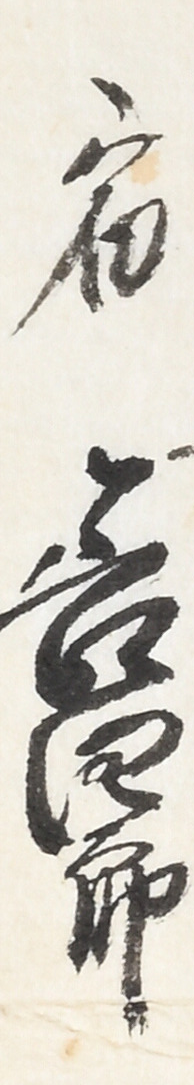宿善四郎
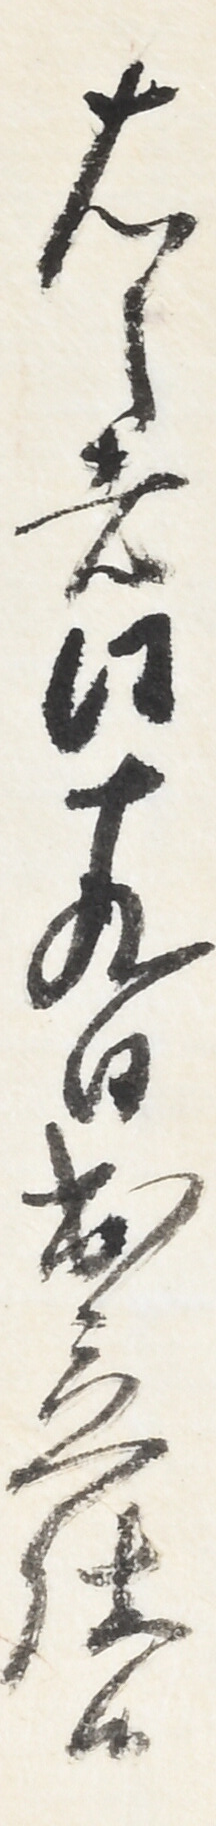右之者同十九日出立仕候
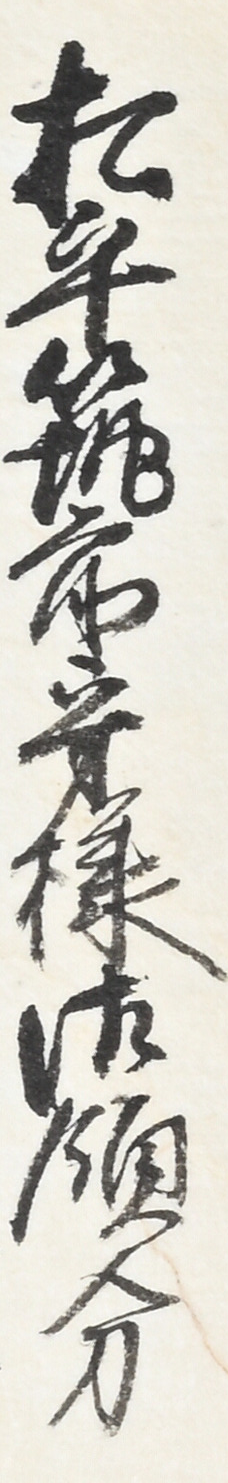松平筑前守様御領分
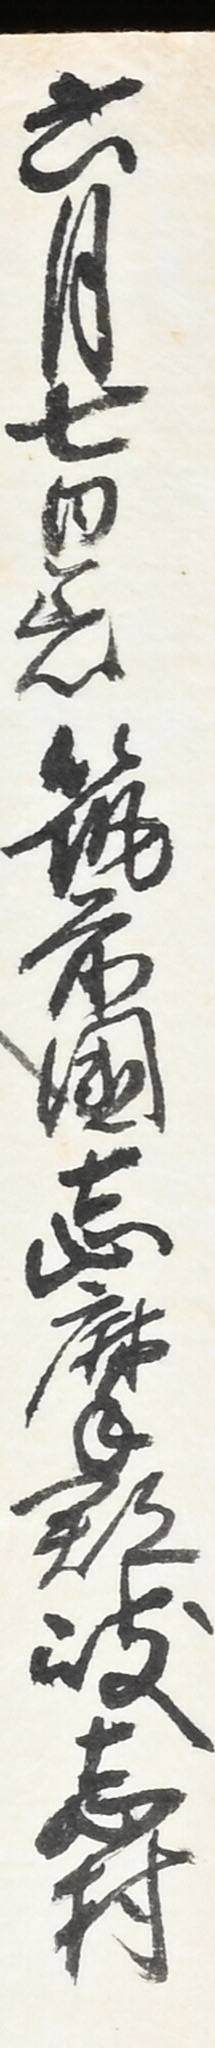六月七日着筑前国志摩郡岐志村
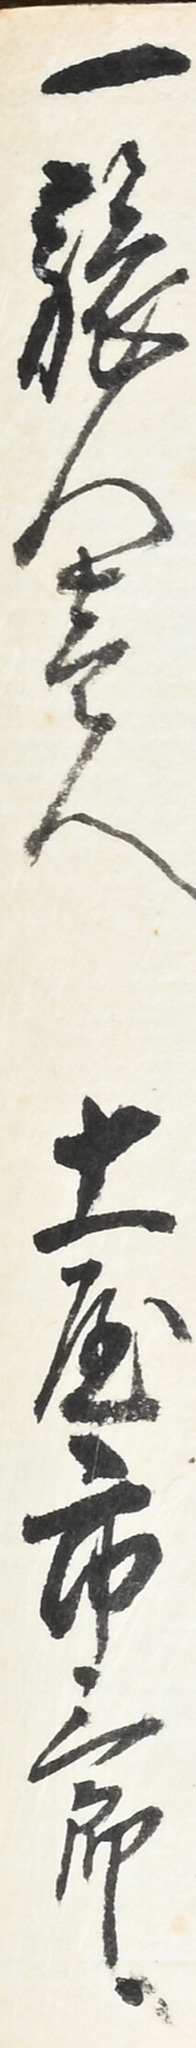一旅人壱人土屋市三郎・
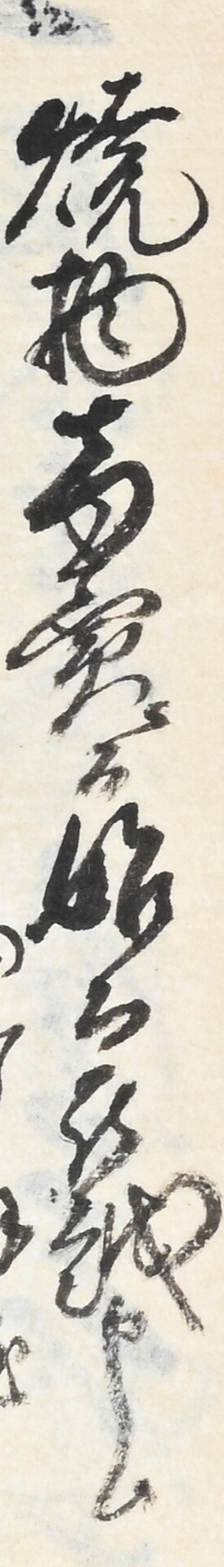小間物商売ニ而例年罷越申候

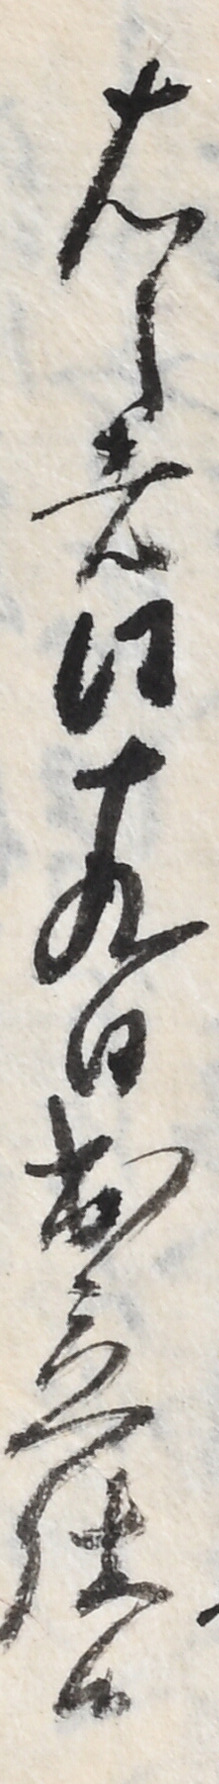右之者同十二日出立仕候
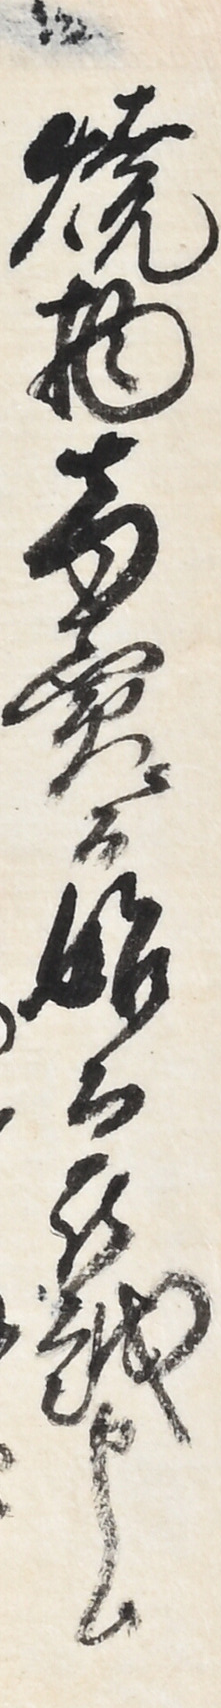焼物商売ニ而始而罷越申候
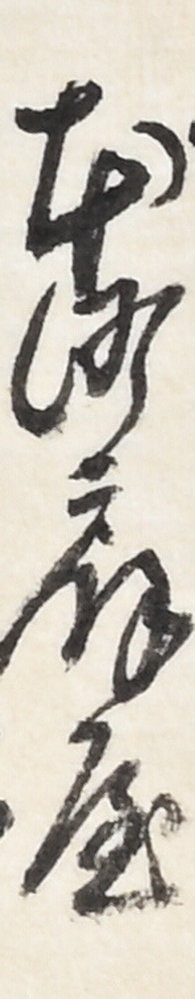本町扇屋
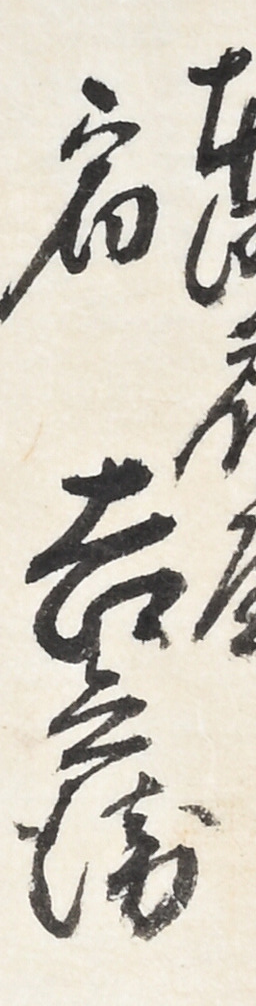宿吉兵衛
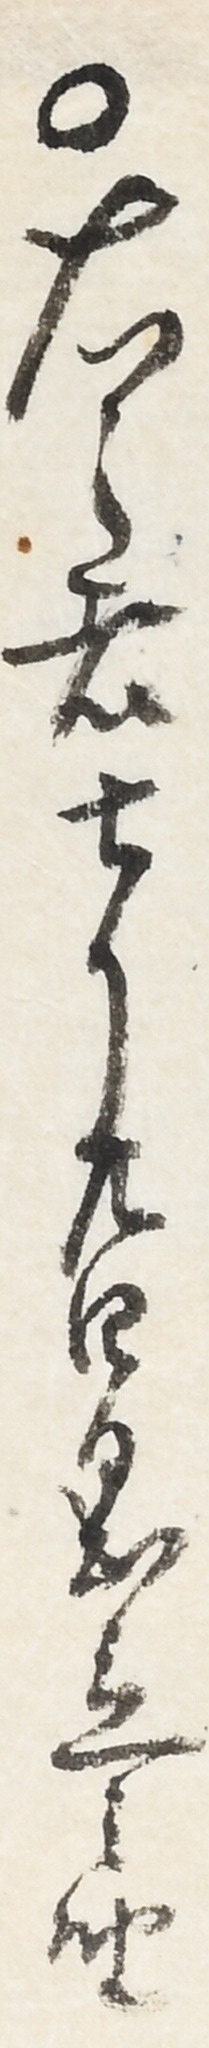〇右之者七月廿四日出立仕候
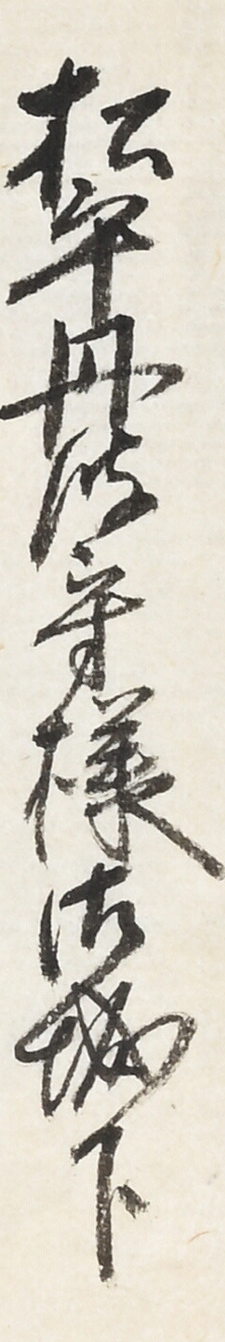松平丹波守様御城下
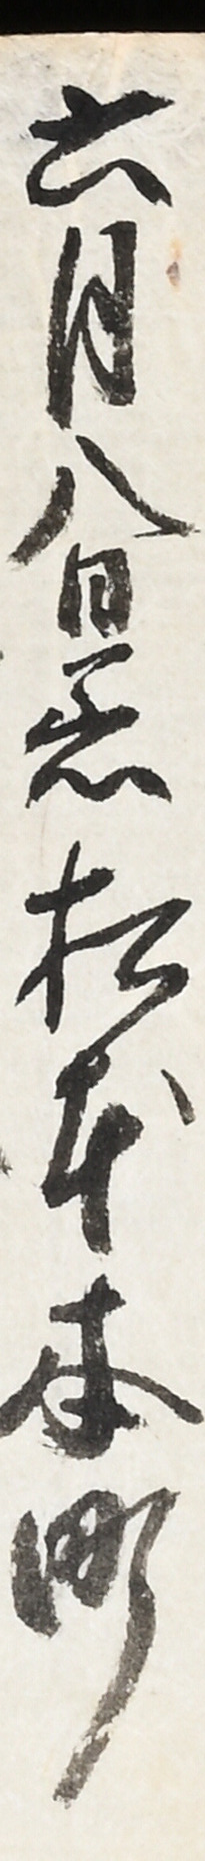六月八日着松本本町
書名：旅人泊控帳
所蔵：伊那市立高遠町図書館・合同会社AMANE
